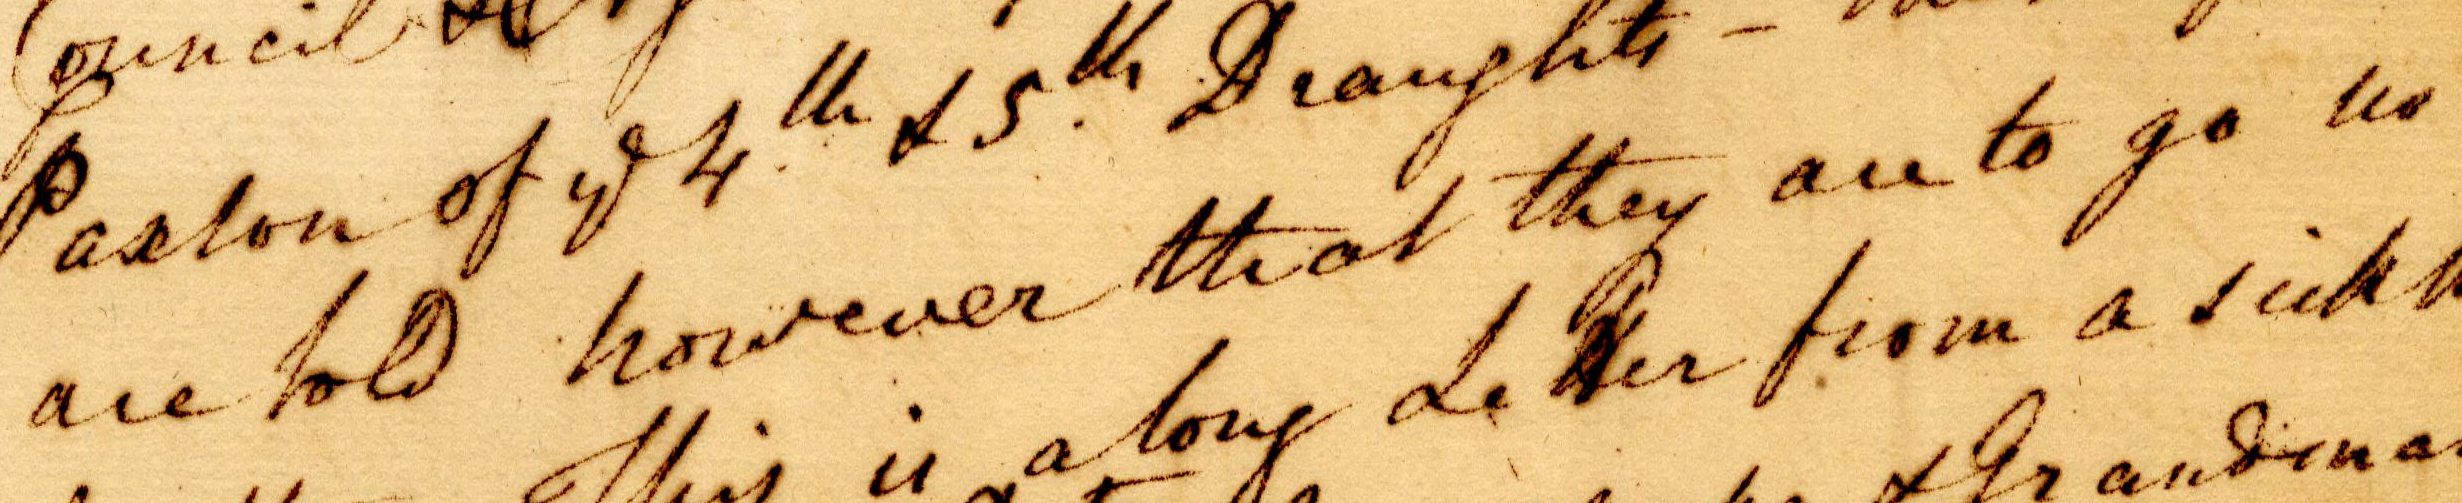are told however that they are to go us
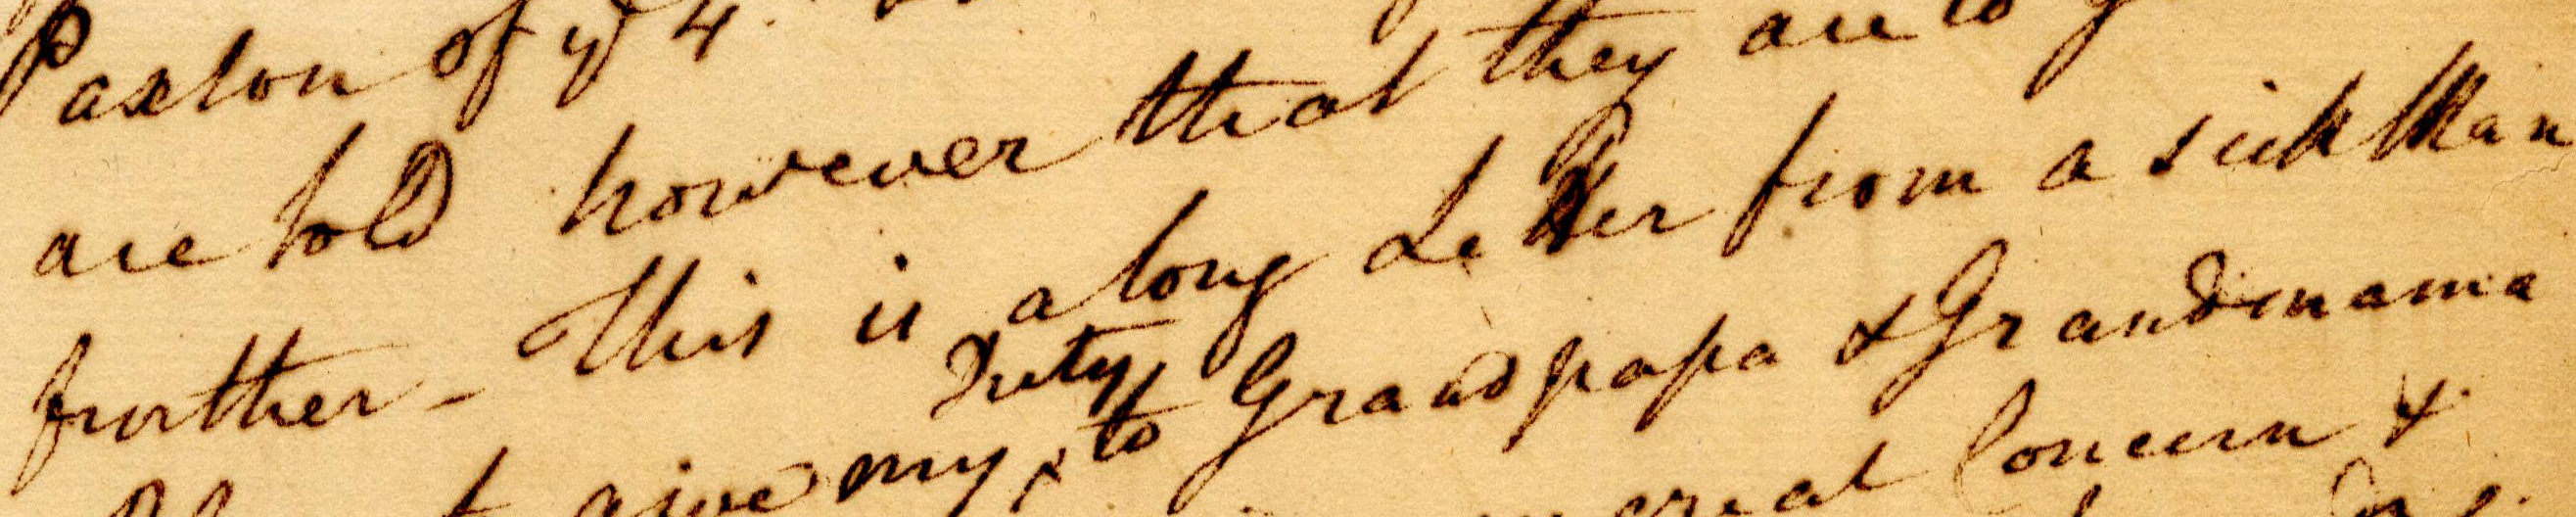further- This is a long Letter from a sick Man
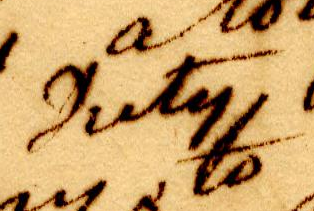Duty
